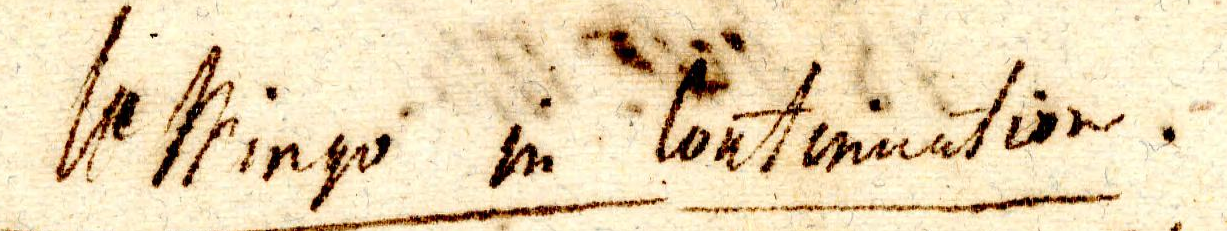W Mingo in Continuation.
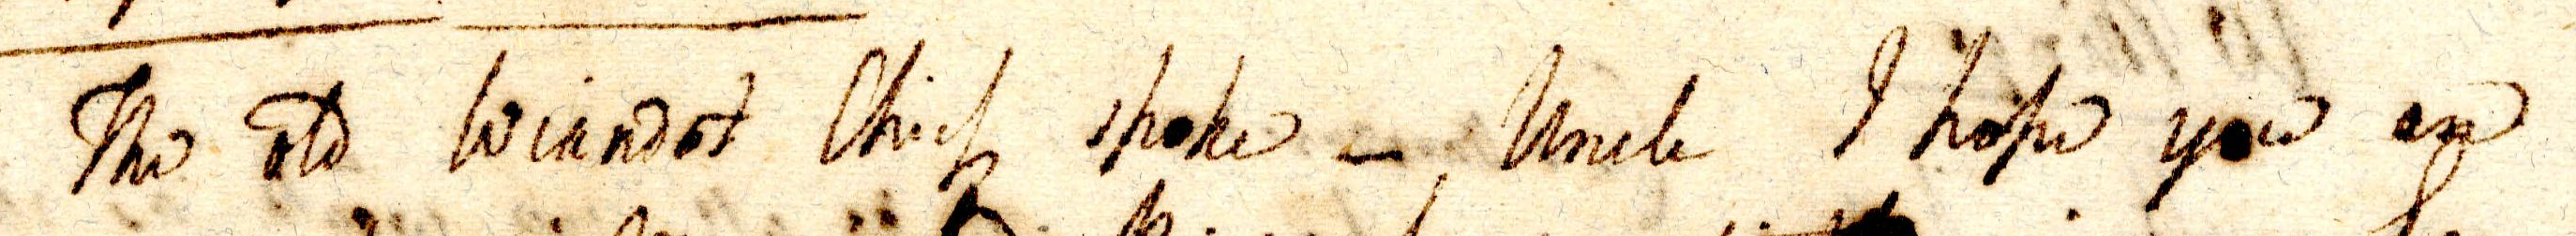The old Wiandot Chief spoke- Uncle I hope you are
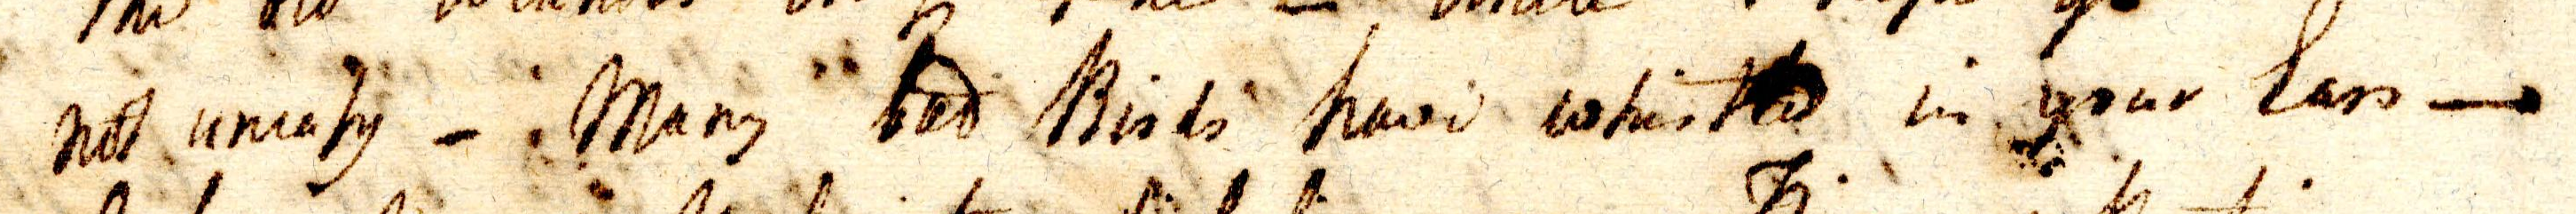not uneasy- Many bad Birds have whistled in your Ears-
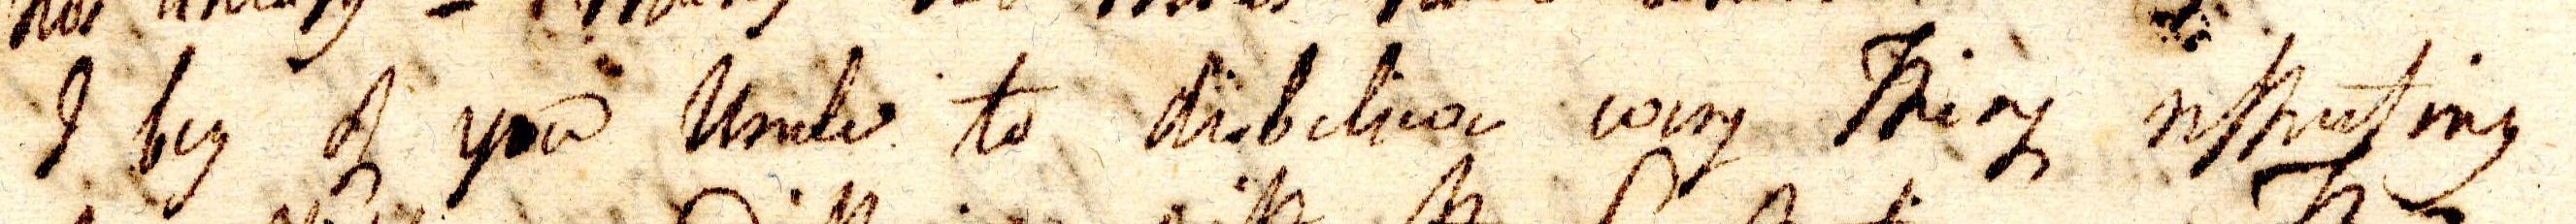I beg of you Uncle to disbelieve every Thing respecting
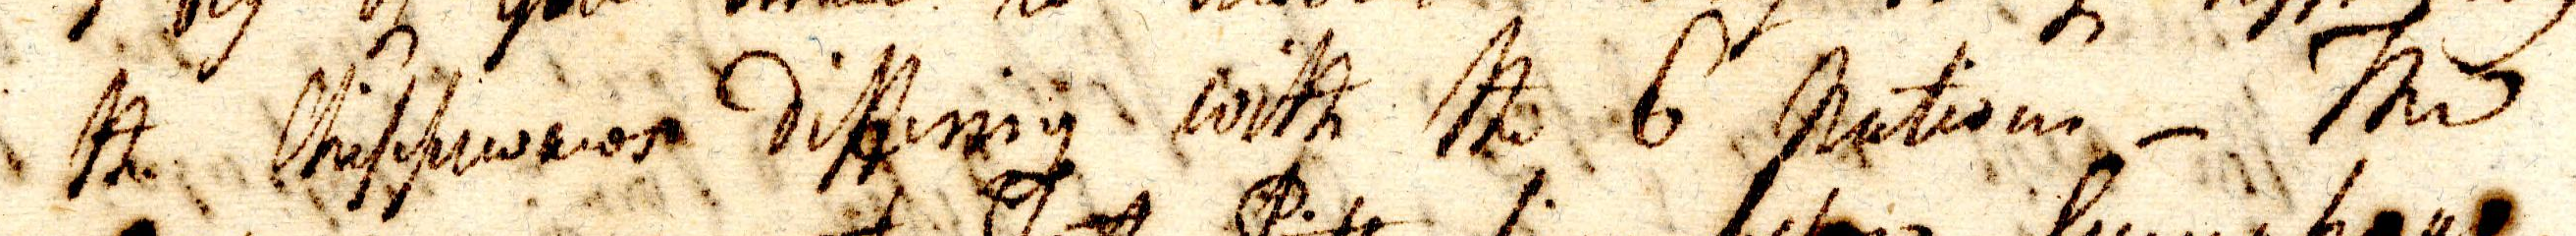the Chippewaws differing with the 6 Nations- The
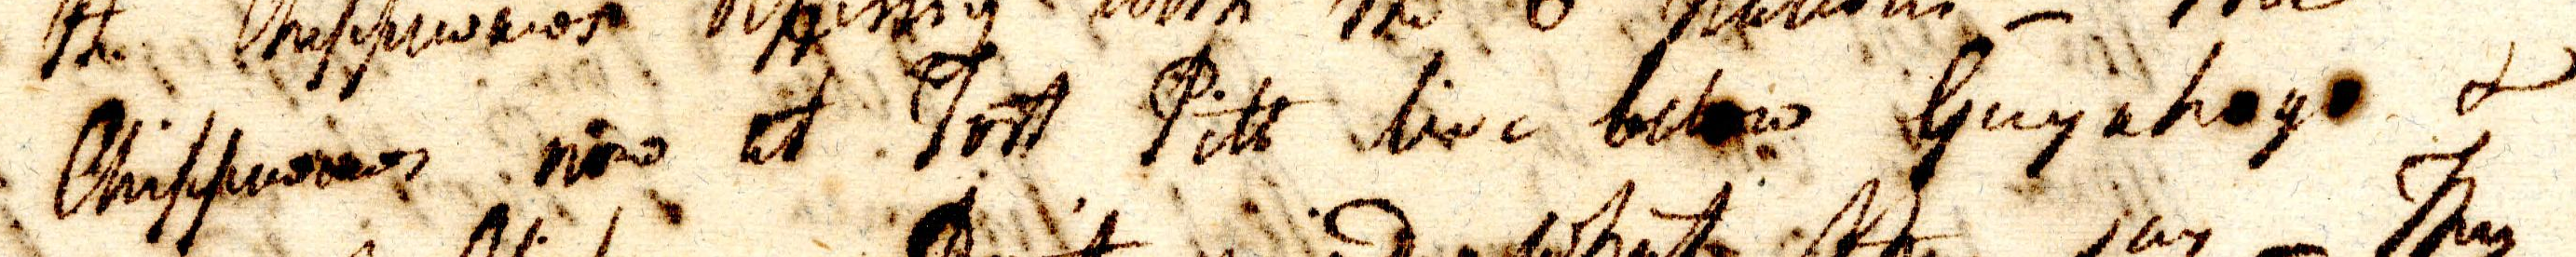Chippewaws now at Fort Pitt live below Cuyahoga &
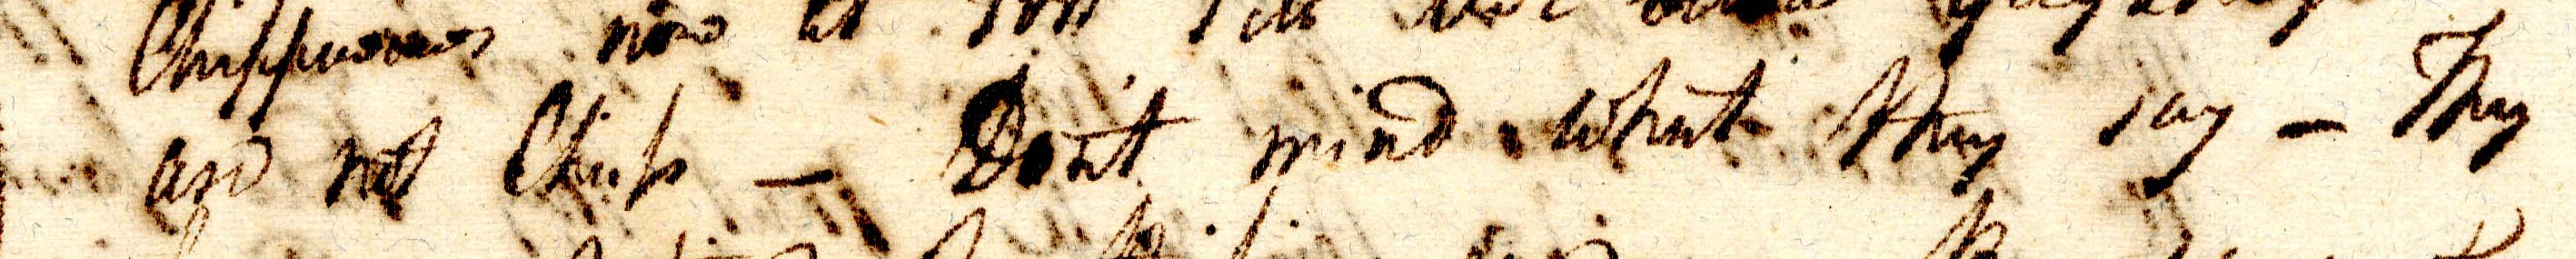are not Chiefs- Don't mind what they say- They
